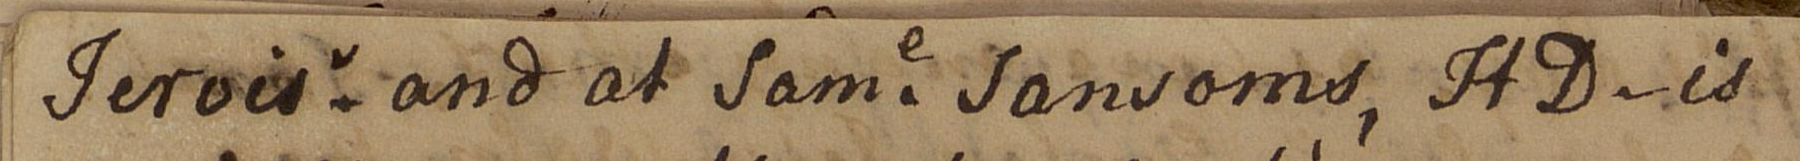Jervis^s. and at Sam^l. Sansoms, HD- is
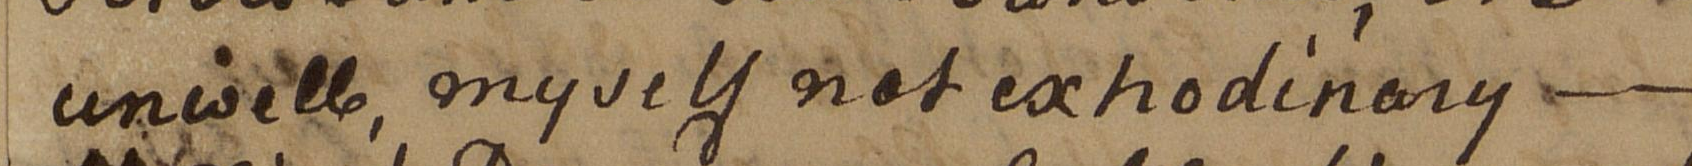unwell, myself not extrodinary-
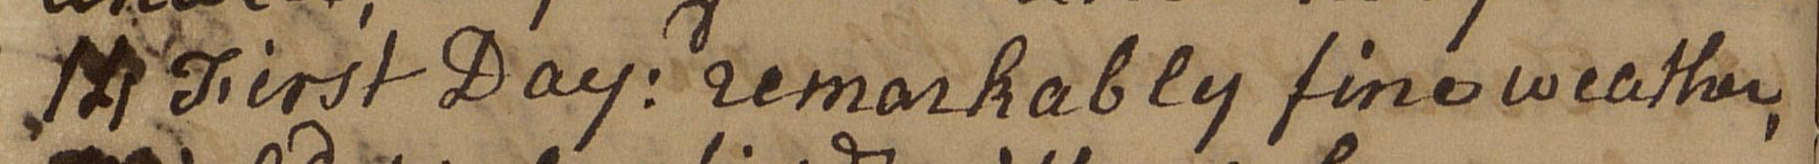14 First Day: remarkably fine weather,
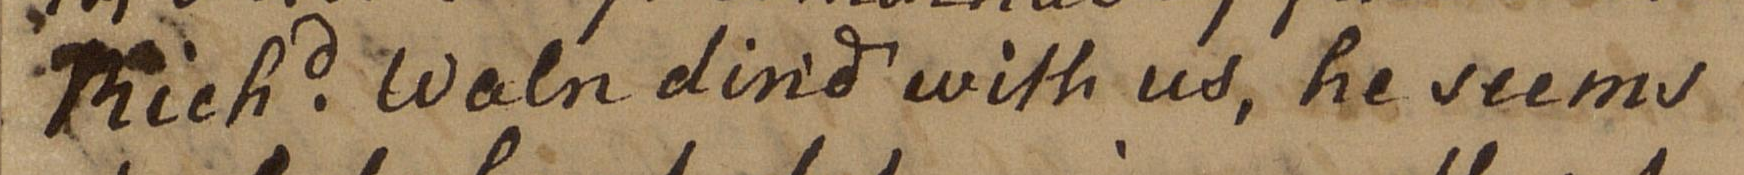Rich^d. Waln din'd with us, he seems
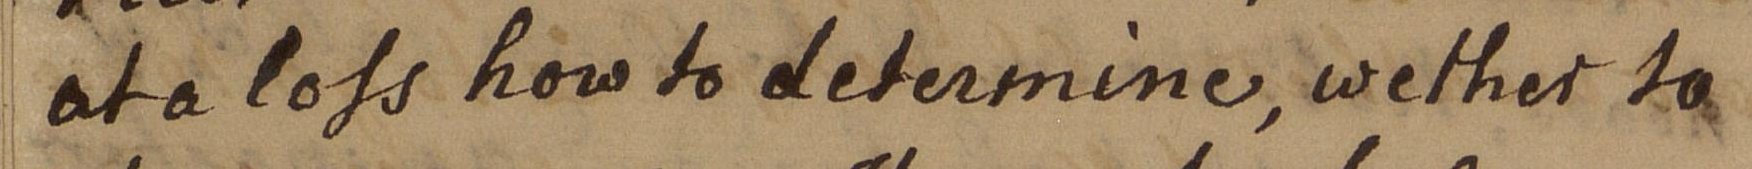at a loss how to determine, wether to
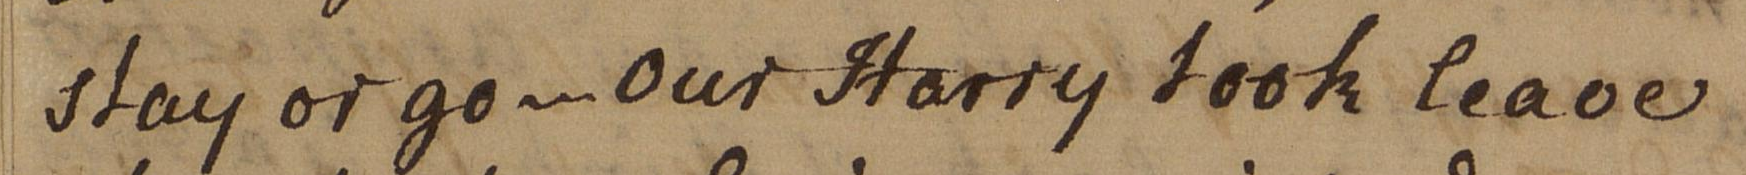stay or go- our Harry took leave
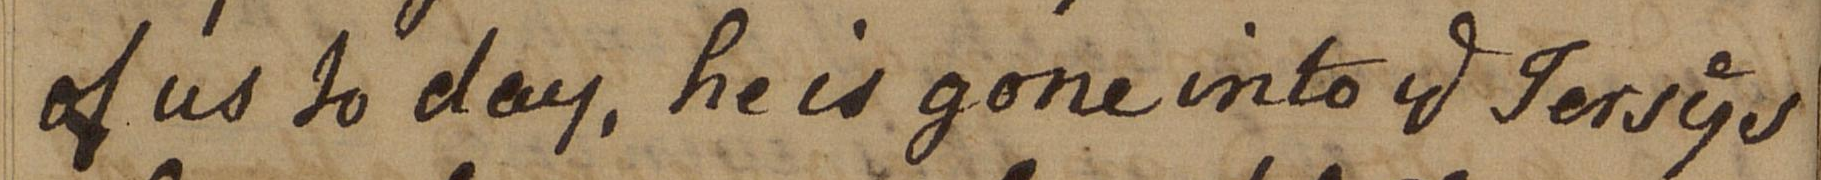of us to day, he is gone into y^e Jers ^e ys
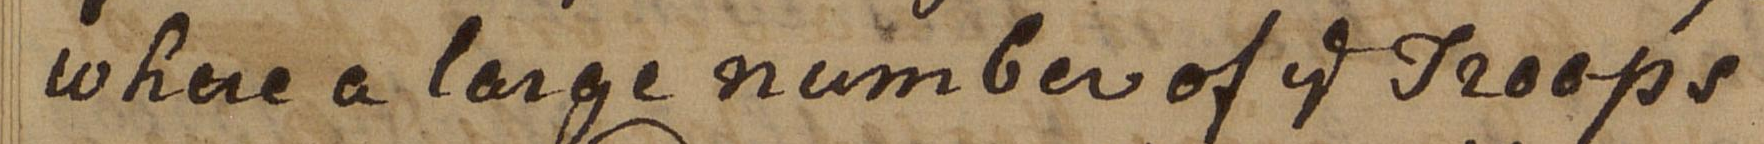where a large number of y^e Troops
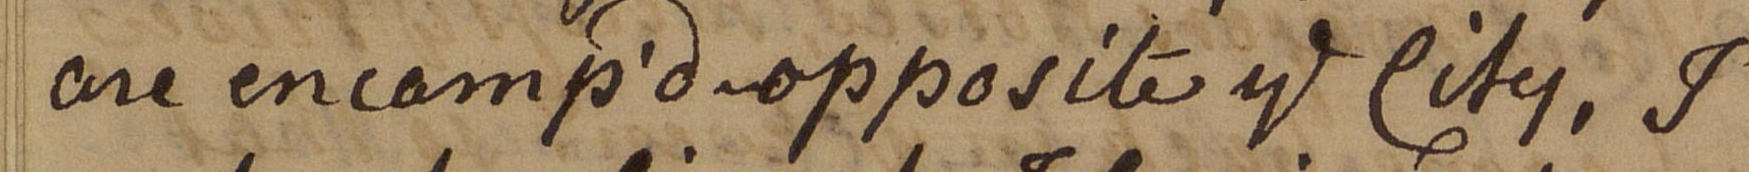are encamp'd opposite y^e City, I
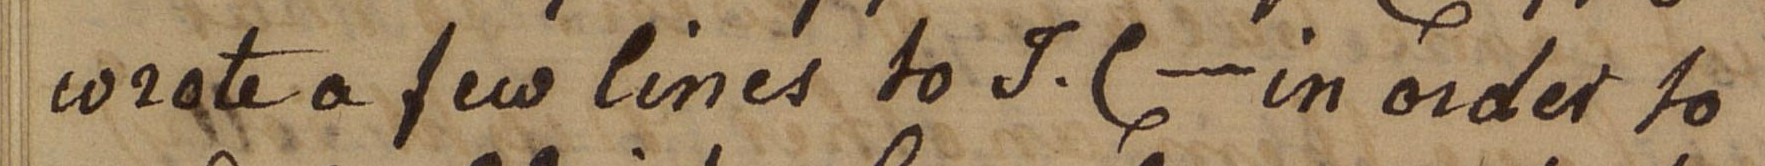wrote a few lines to J.C- in order to
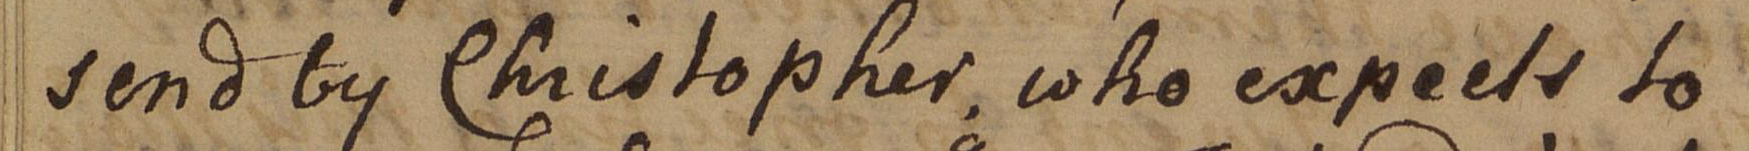send by Christopher, who expects to
